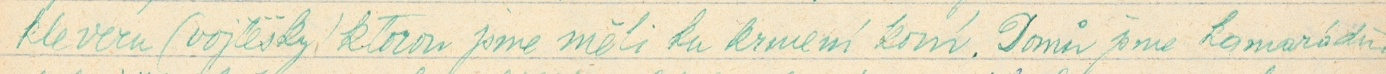kleveru (vojtěšky) kterou jsme měli ku krmení koní. Domů jsme kamarádům
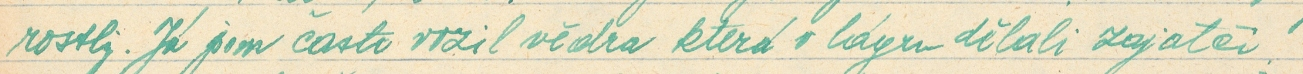rostly. Já jsem často vozil vědra která v lágru dělali zajatci.
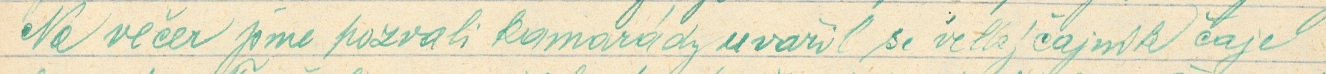Na večer jsme pozvali kamarády uvařil se velký čajník čaje
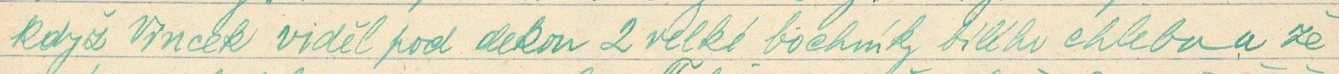když Vincek viděl pod dekou 2 velké bochníky bílého chleba a že
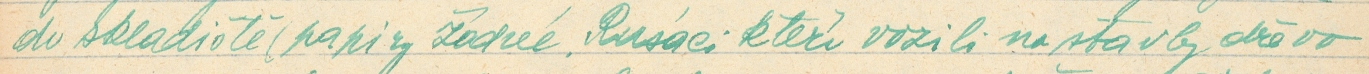do skladiště (papíry žádné. Rusáci kteří vozili na stavby dřevo
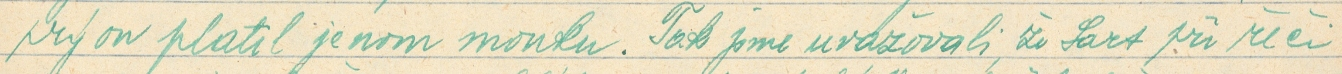prý on platil jenom mouku. Tak jsme uvažovali, že Sart při řeči
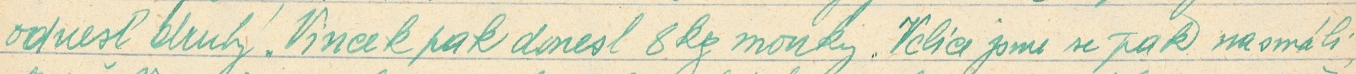odnesl druhý. Vincek pak donesl 8 kg mouky. Velice jsme se pak nasmáli,
